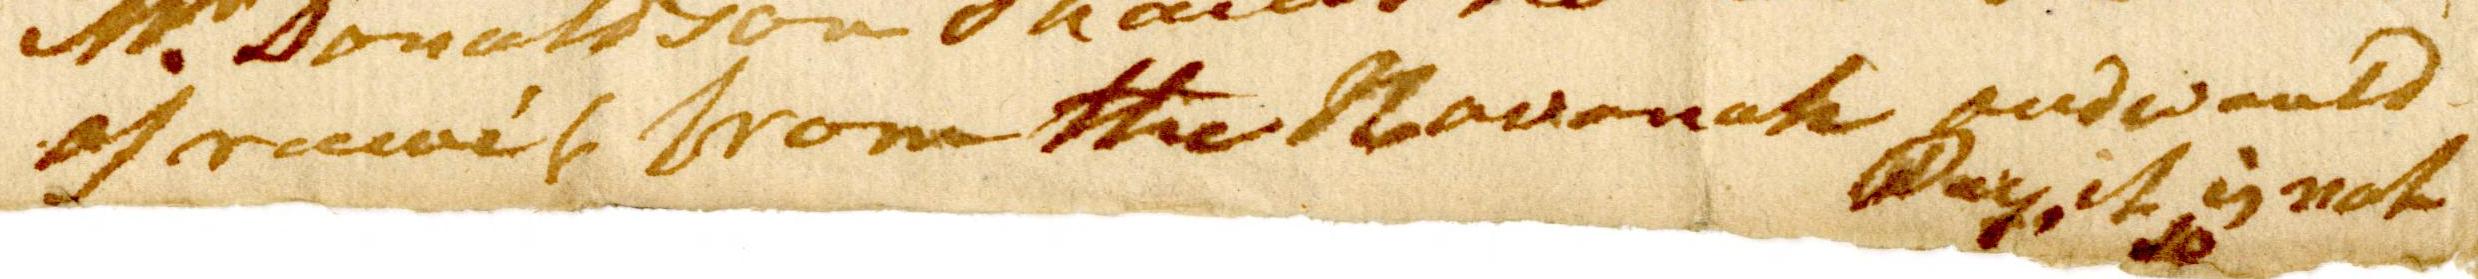as received from the Navarnak and would
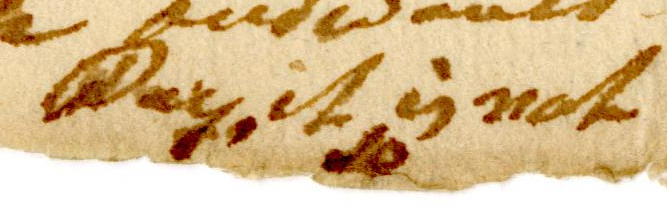Day, it is not
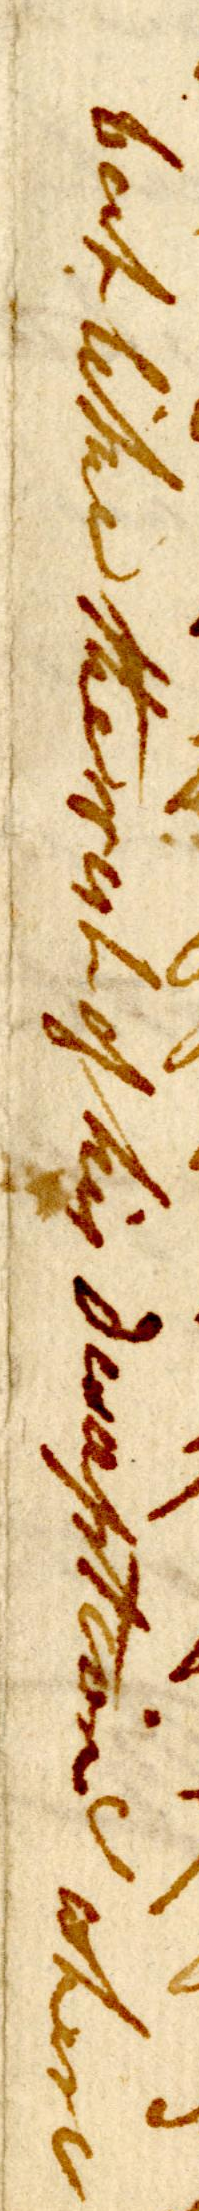but like the rest of his desception where
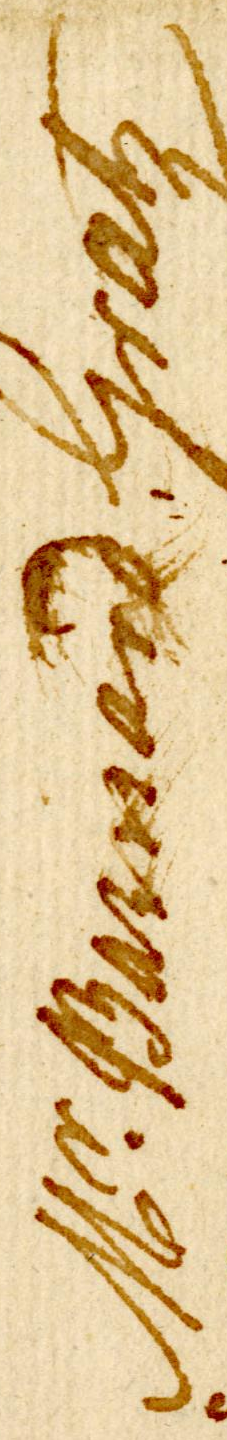M^r Barnand Gratz
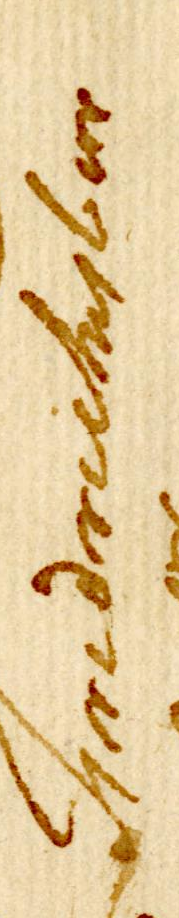Fredricksbur
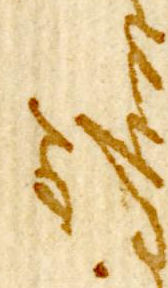or
